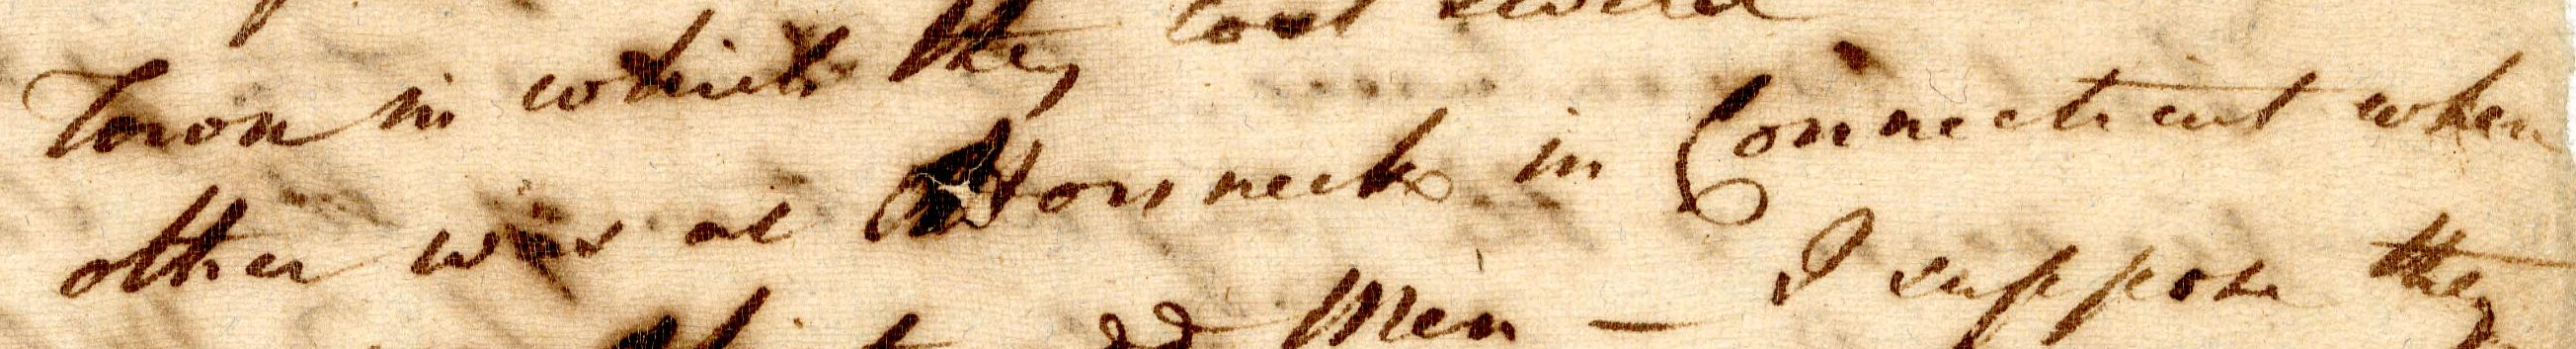other was at Horsneck in Connecticut where
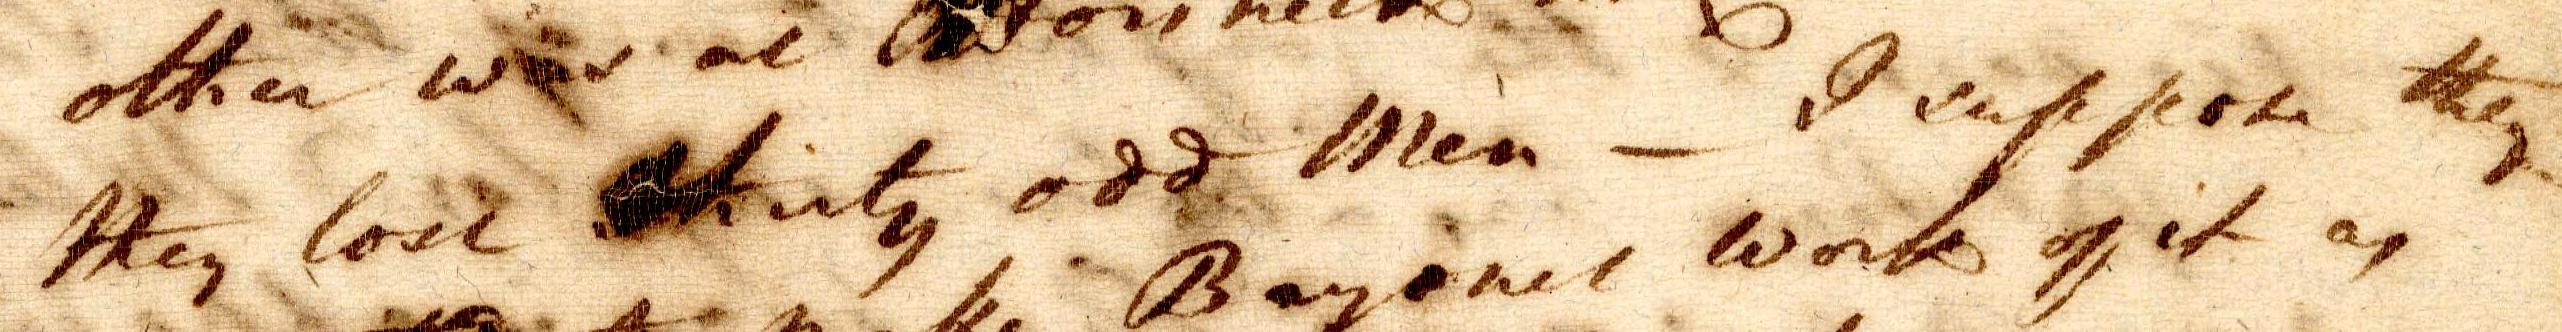they lost thirty odd Men- I suppose they
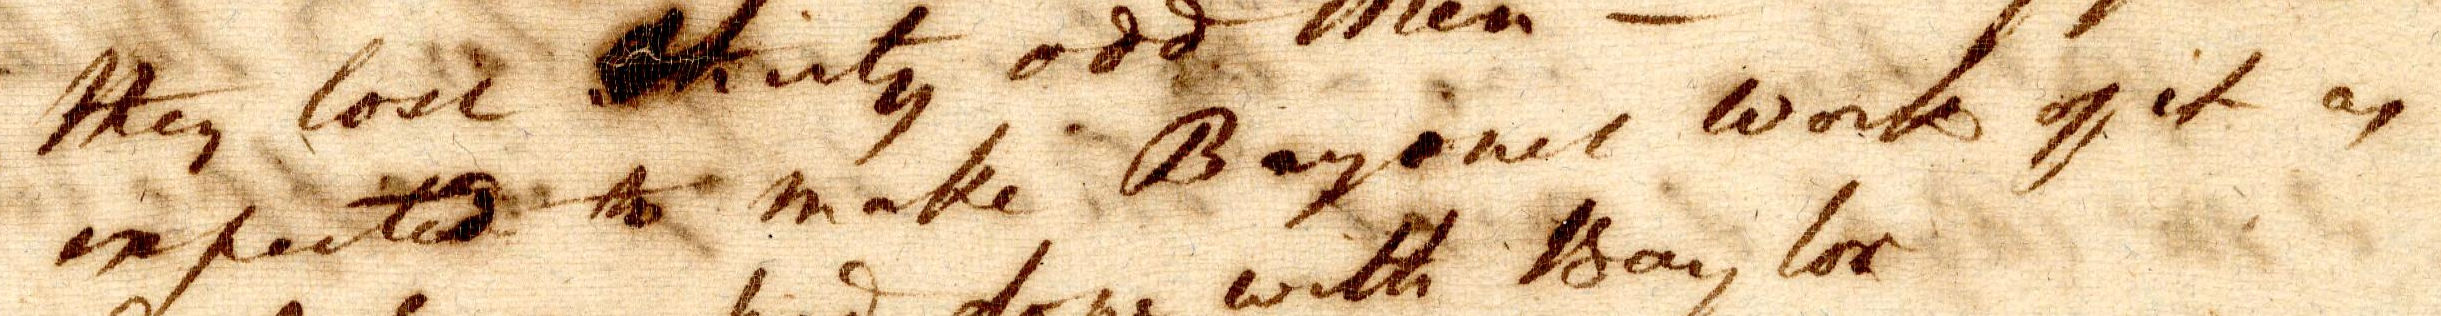expected to make Bayonet work of it as
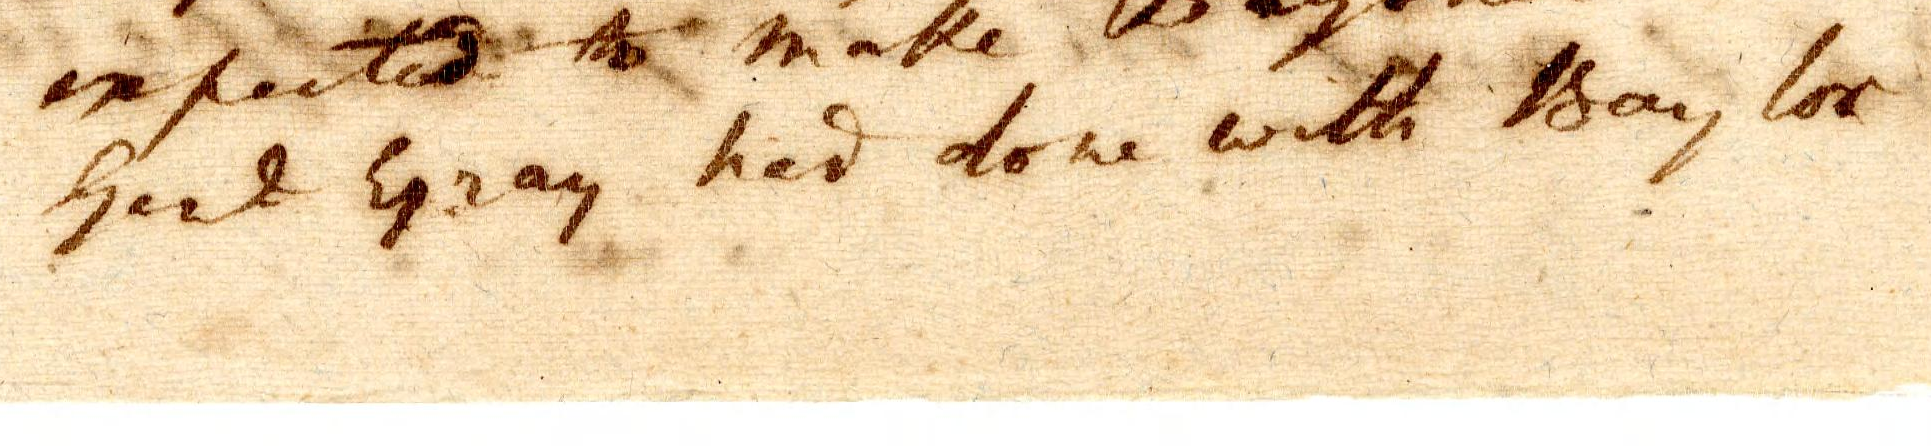Gen^l Gray had done with Baylor
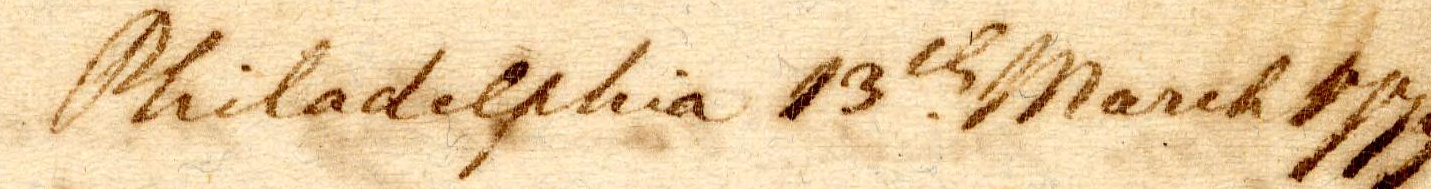Philadelphia 13^th. March 1779
